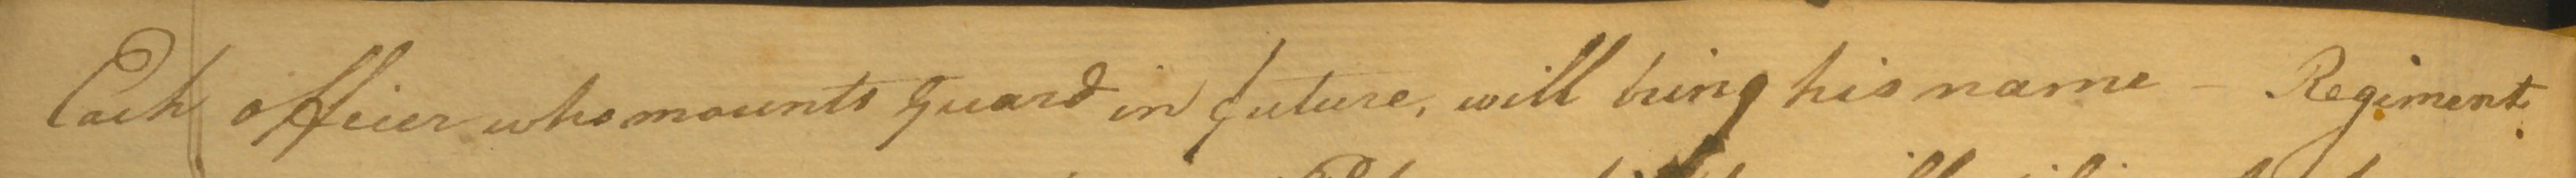Each officer who mounts Guard in future will bring his name Regiment
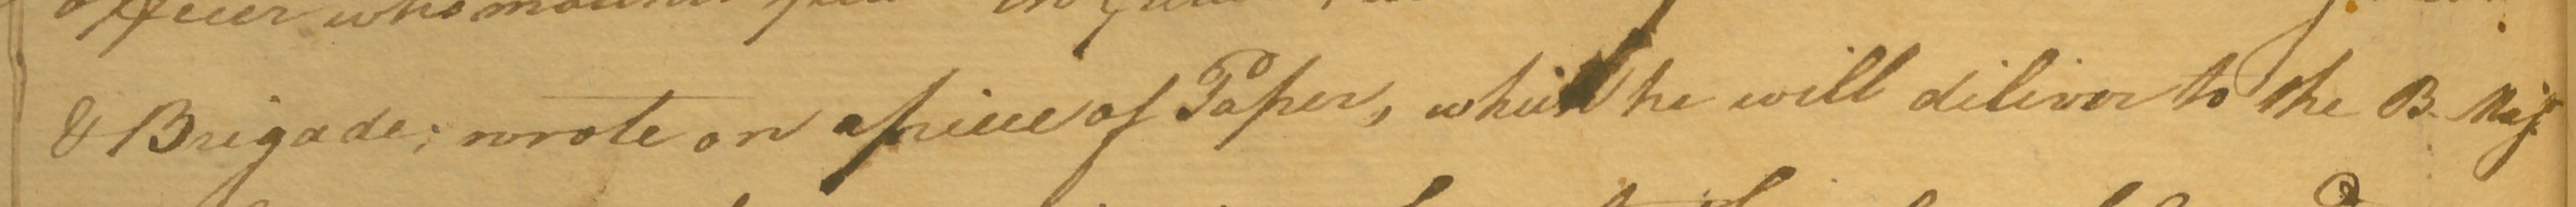& Brigade wrote on a piece of Paper, which he will deliver to the B. Maj.
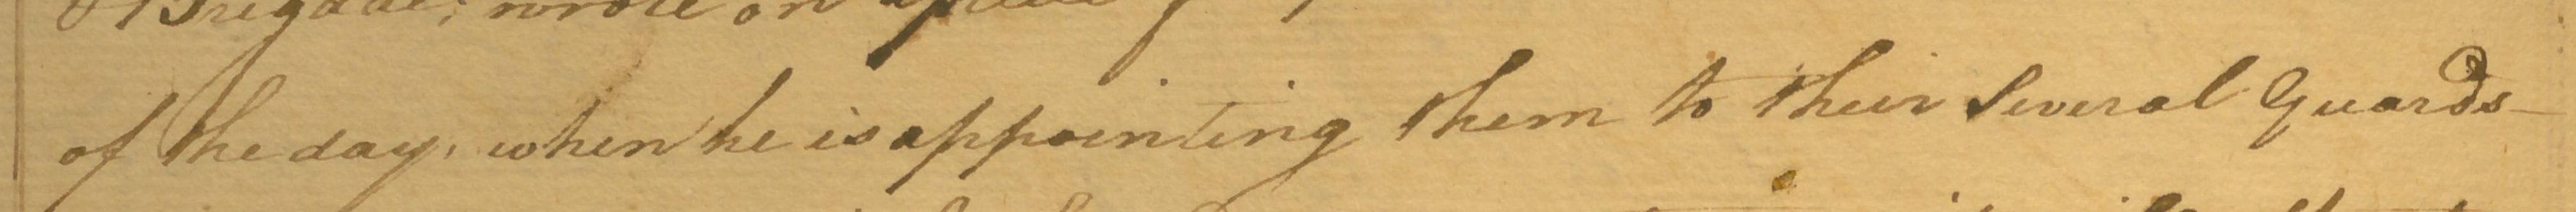of the day, when he is appointing them to their several Guards-
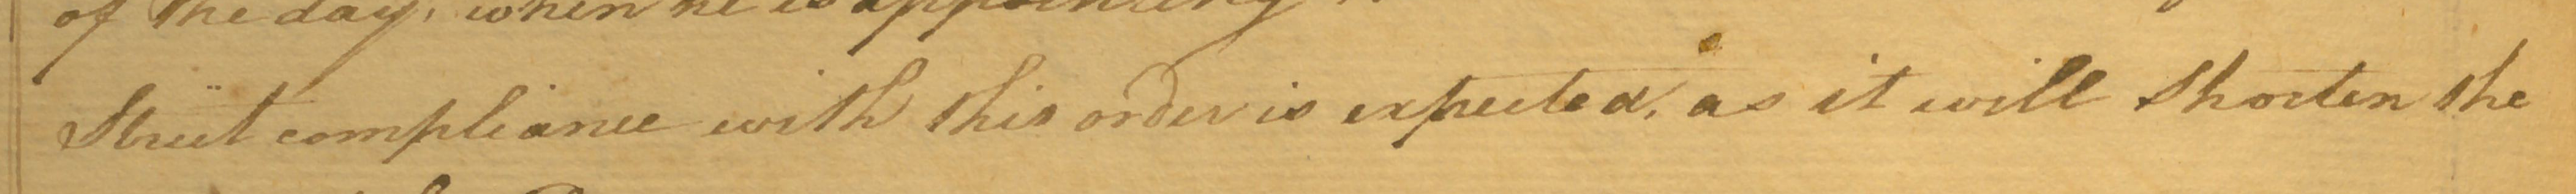Strict compliance with the order is expected, as it will shorten the
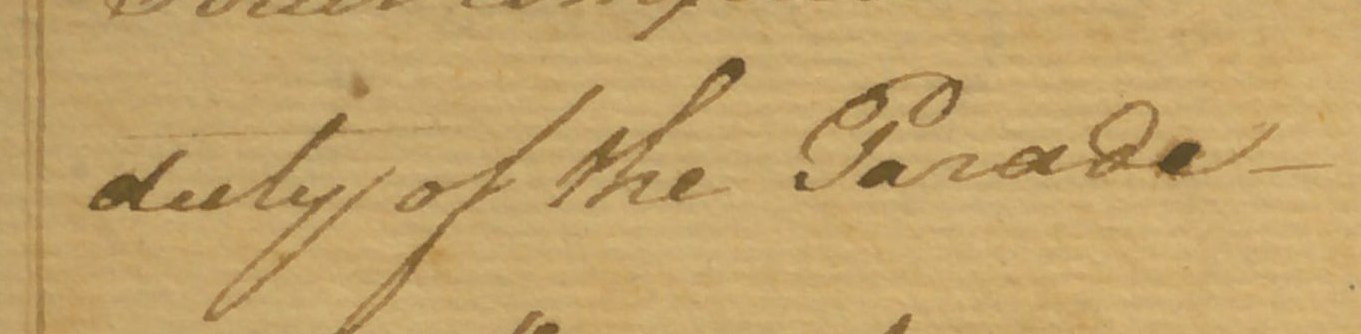duty of the Parade-
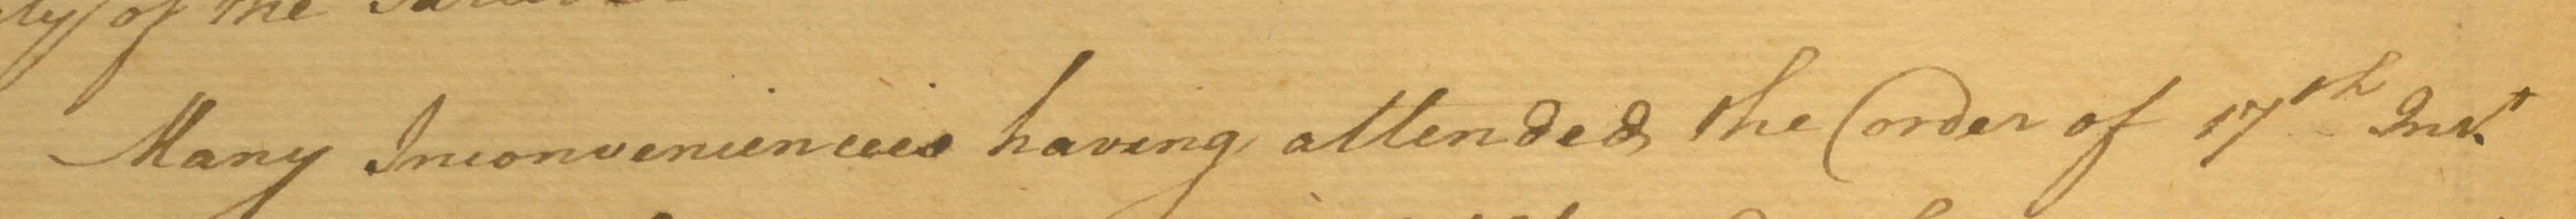Many Inconveniences having attended the order of the 17^th Ins^t.
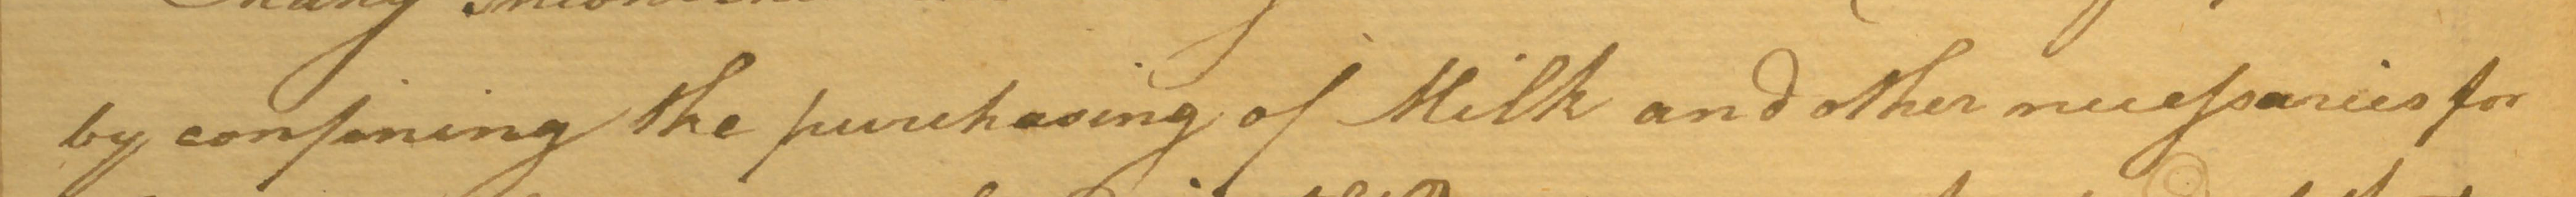by confining the purchasing of Milk and other necessaries for
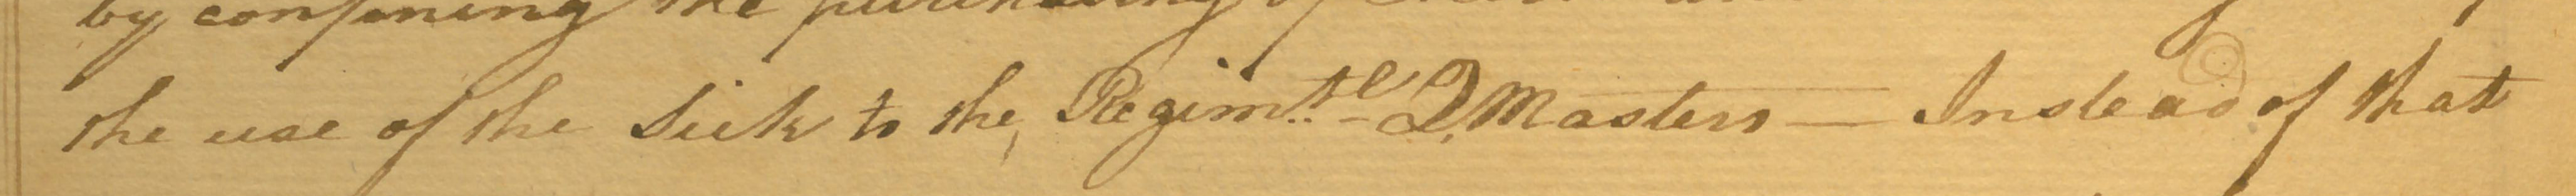the use of the Sick to the Regim^tl. Q. Masters- Instead of that
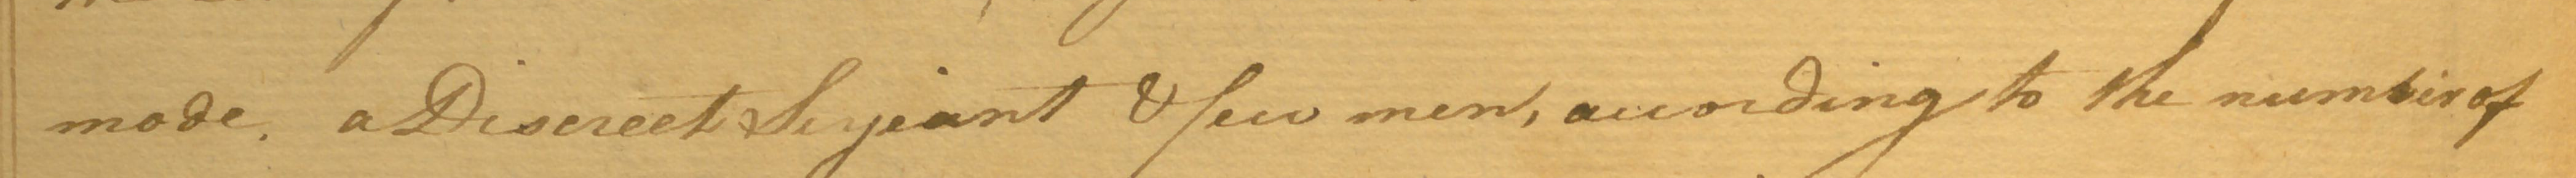mode. a Discreet Serjeant & few men, according to the numbir of
